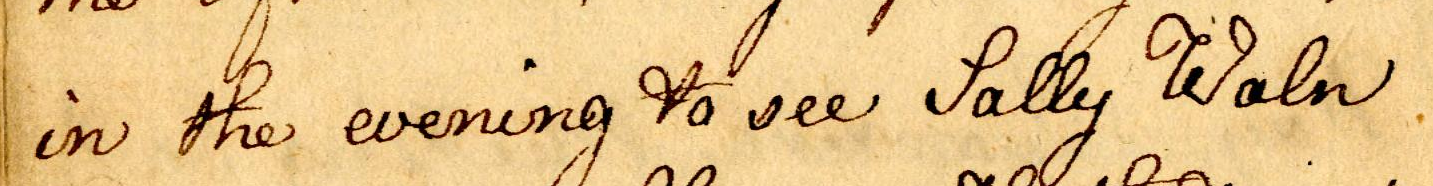in the evening to see Sally Waln
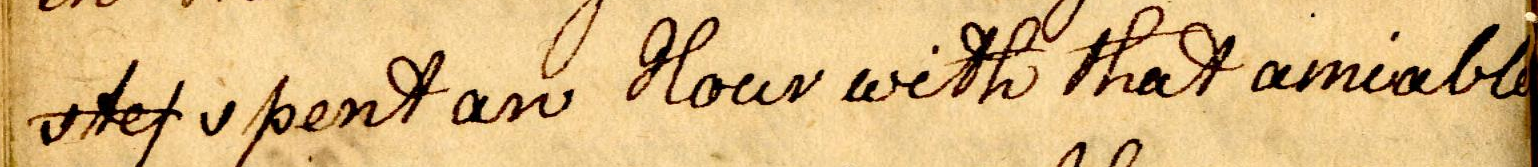[stet] spent an Hour with that amiable
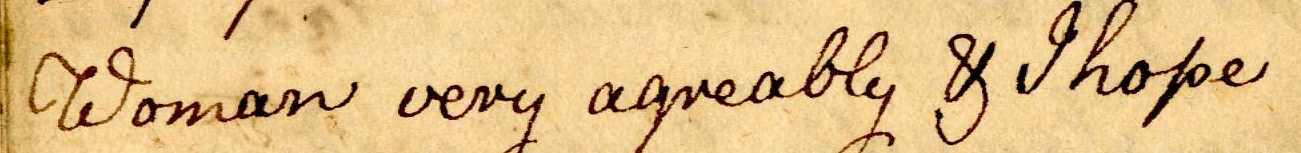Woman very agreably & I hope
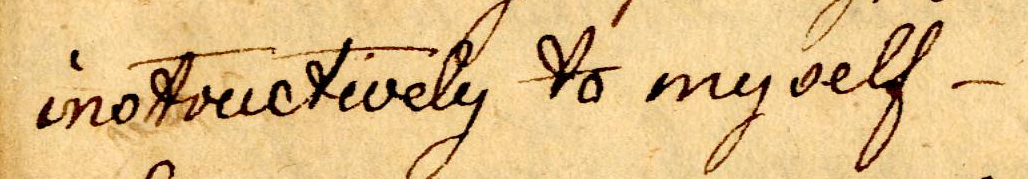instructively to myself -
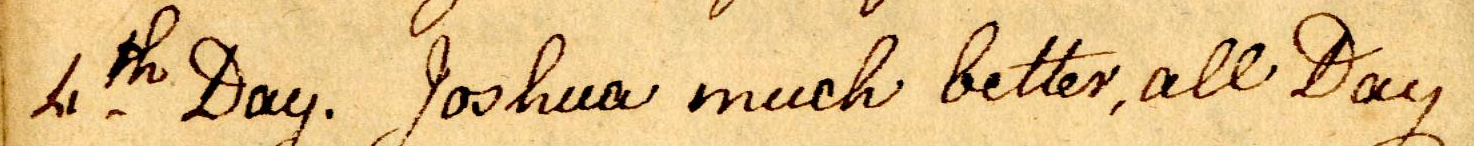4^th Day. Joshua much better, all Day
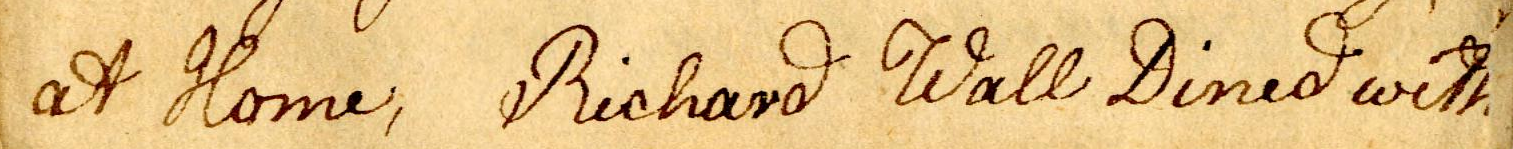at Home, Richard Wall Dined with
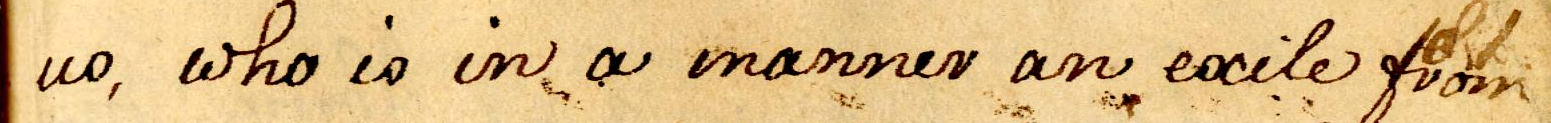us, who is in a manner an exile from
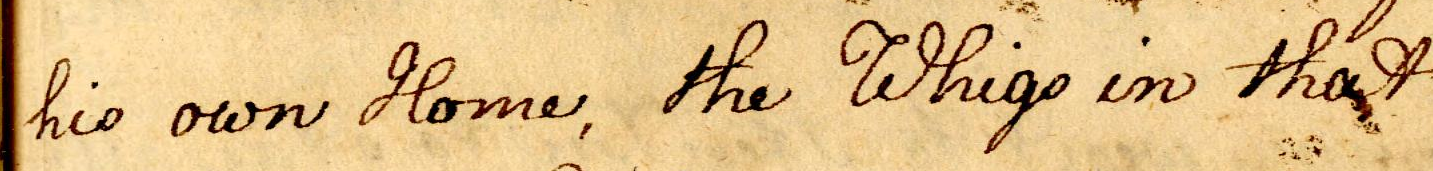his own Home, the Whigs in that
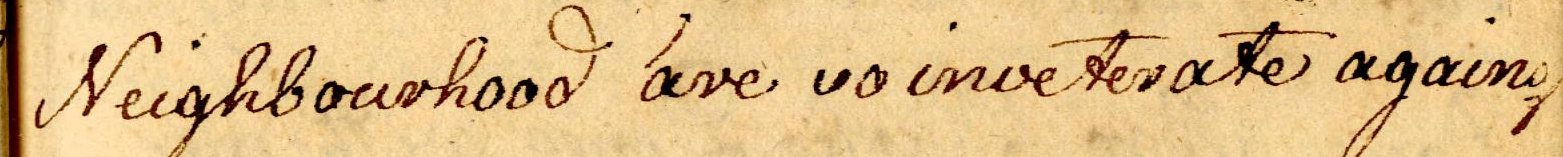Neighbourhood are so inveterate agains
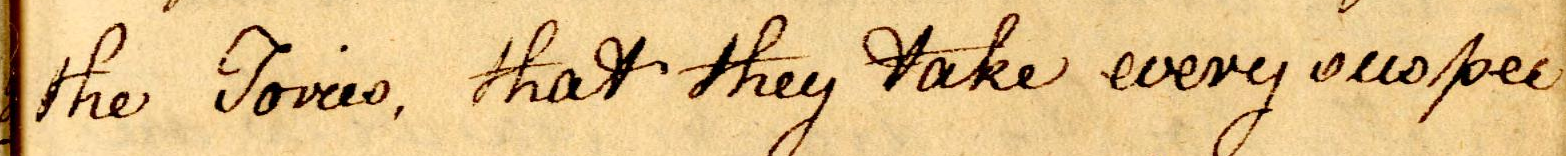the Tories, that they take every suspec
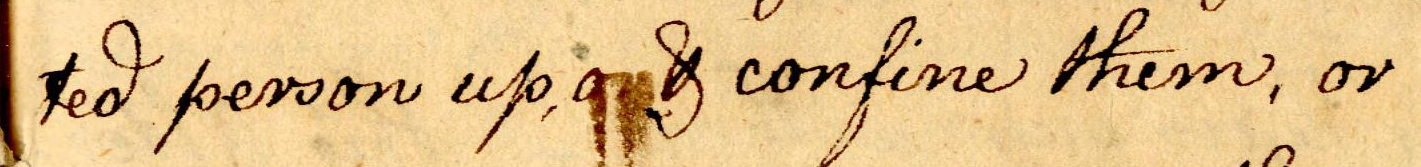ted person up, [_] & confine them, or
